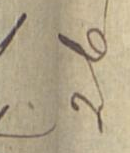26
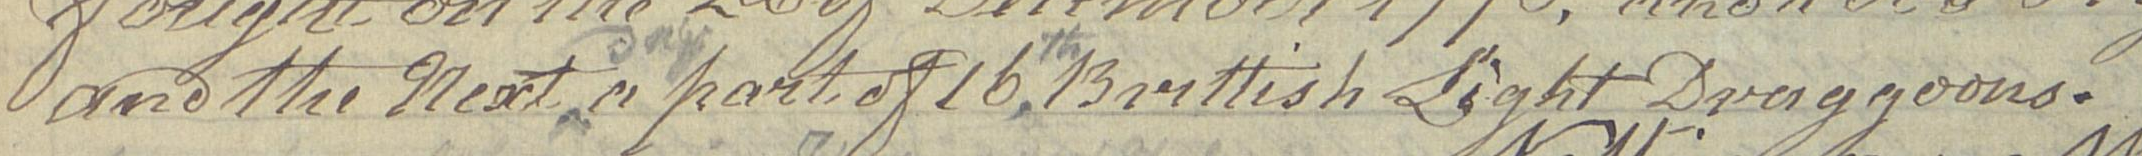and the Next a part of 16^th Brittish Light Draggoons.
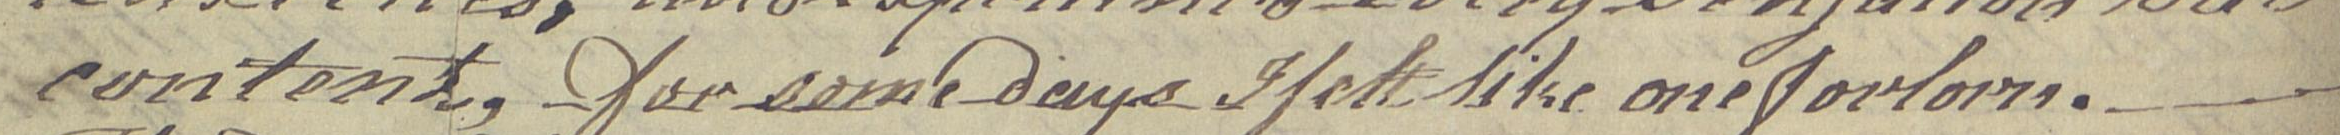content, for some days I felt like one forlorn.
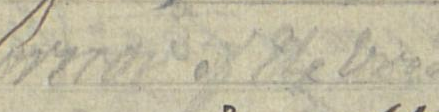[_____] of Hebrod
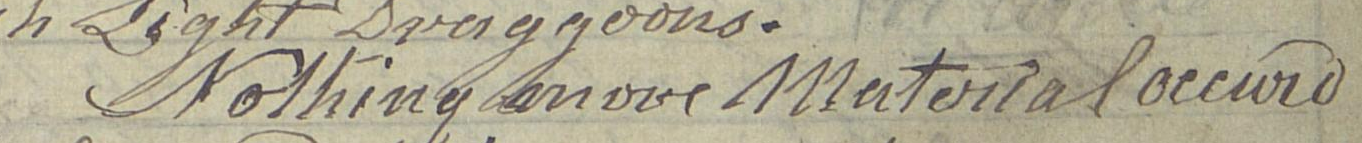Nothing more Material occurd
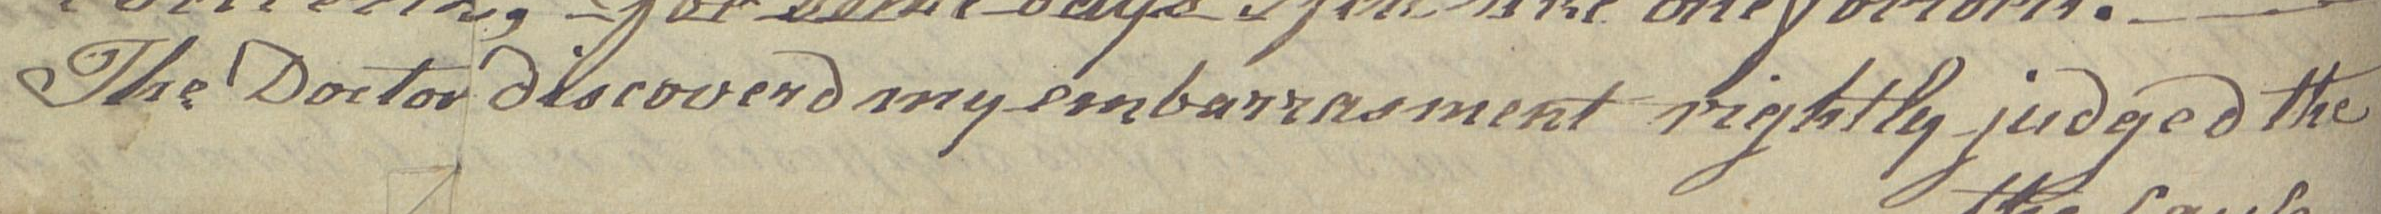The Doctor discover'd my Embarrasment rightly judged the
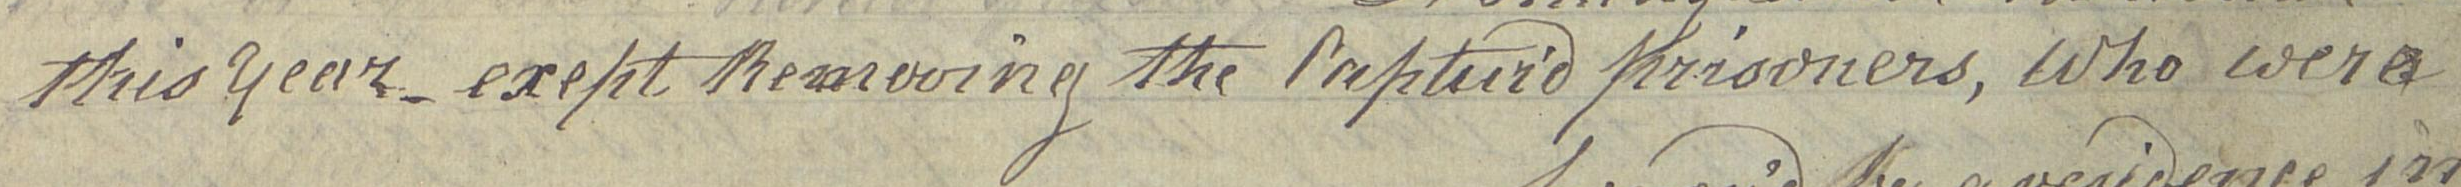this year exept Removing the Captur'd prisoners, who were
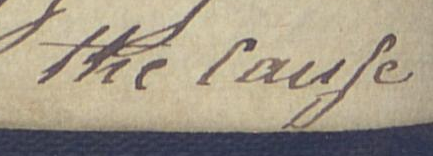the cause
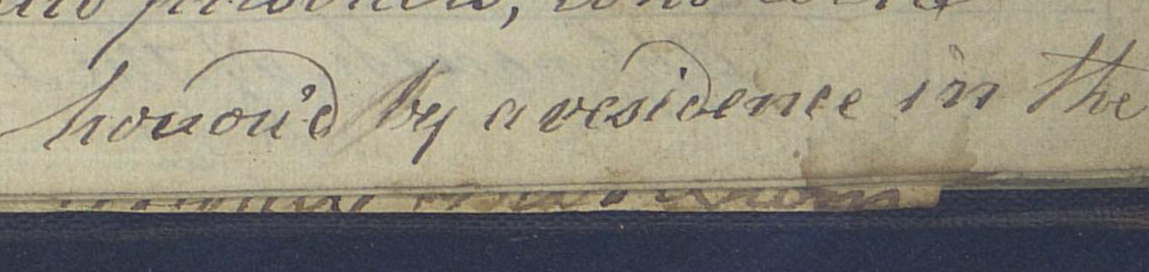housou'd by a residence in the
